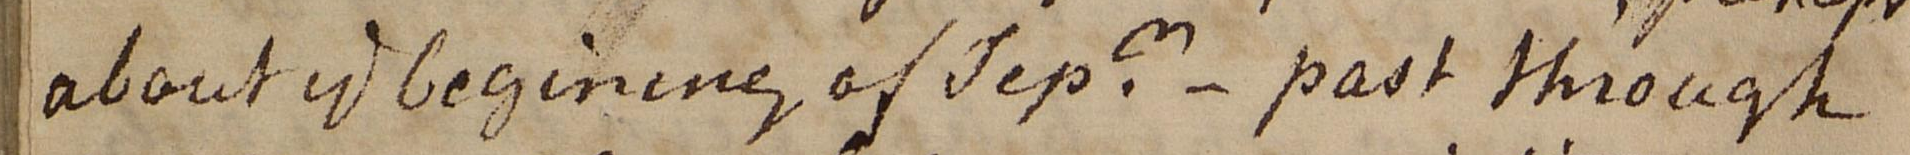about y^e begining of Sep^r.- past through
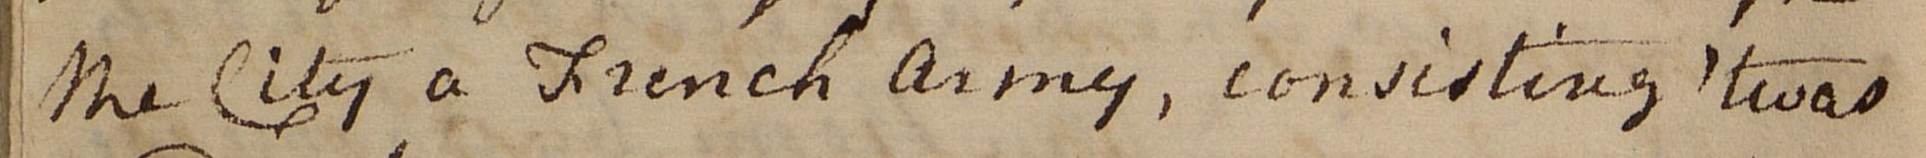the City a French army, consisting 'twas
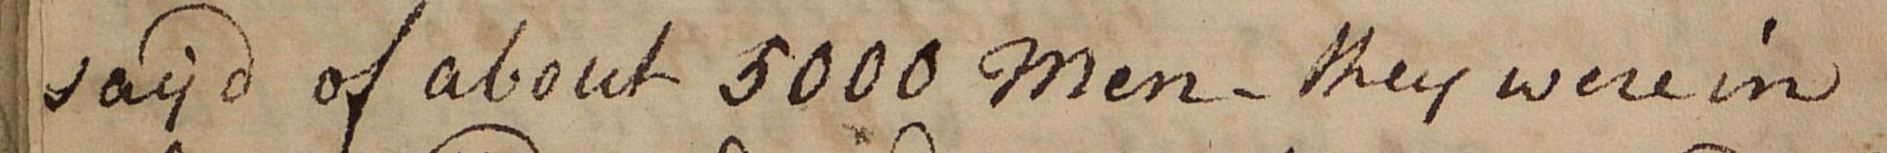say'd of about 5000 Men-they were in
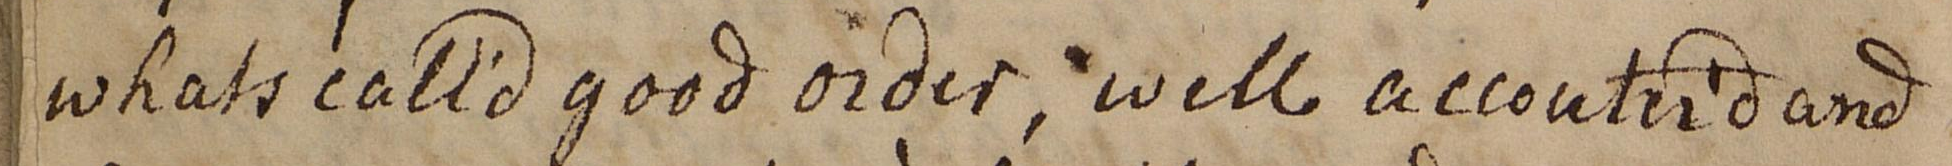whats call'd good order, well accoutn'd and
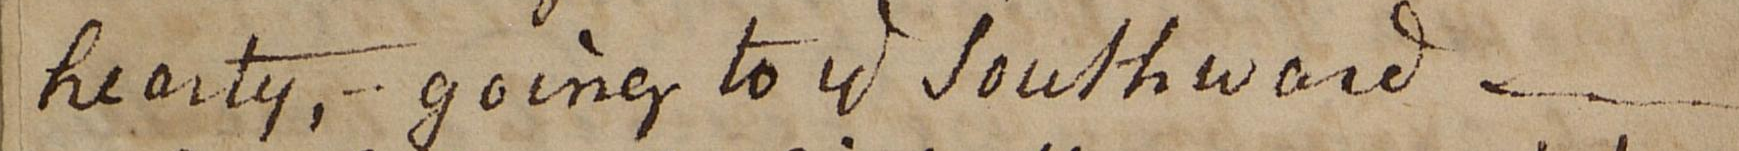hearly,- going to y^e Southward-
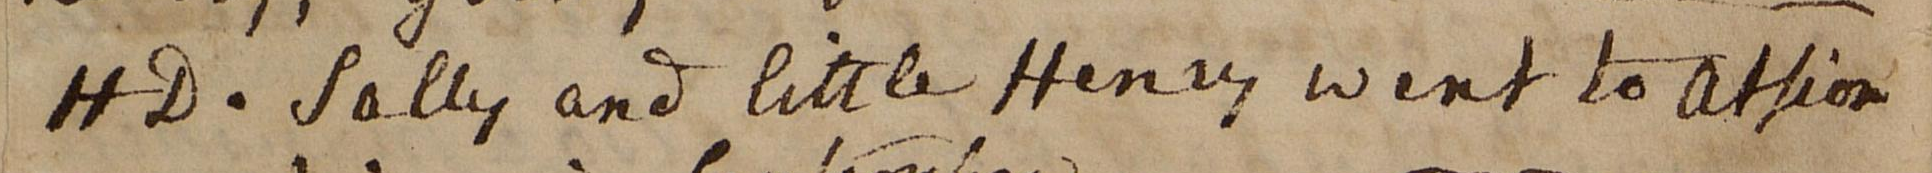HD. Sally and little Henry went to Atsion
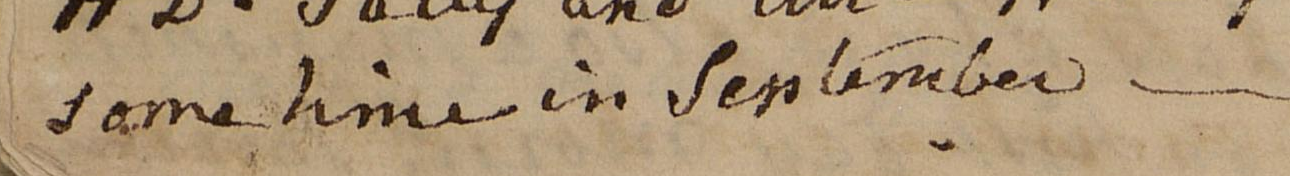some time in September-
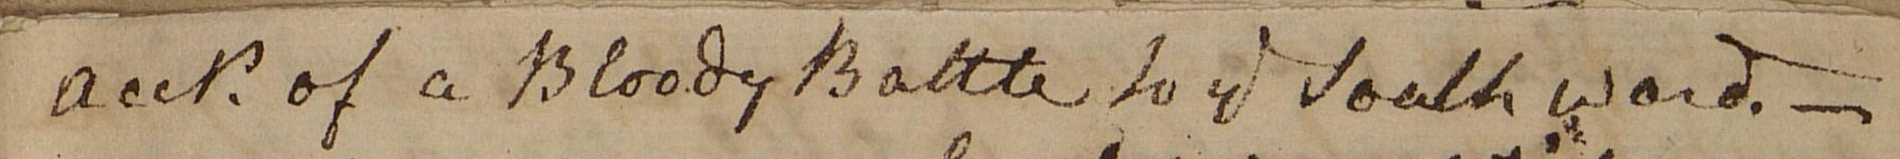acct^s. of a Bloody Battle to y^e South word.-
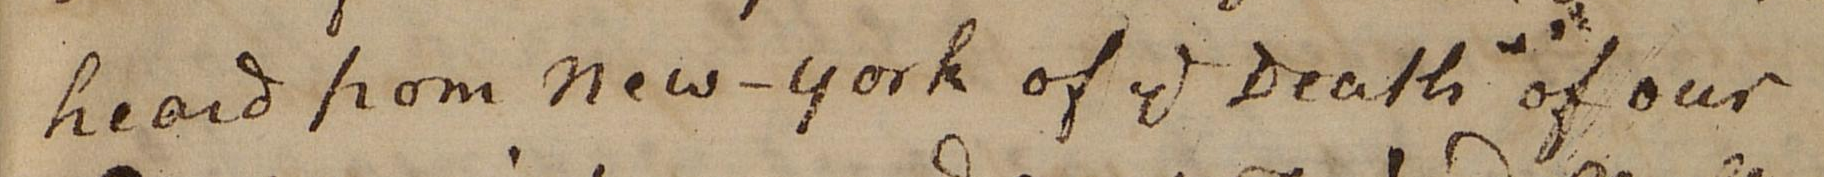heard from New-York of y^e Death of our
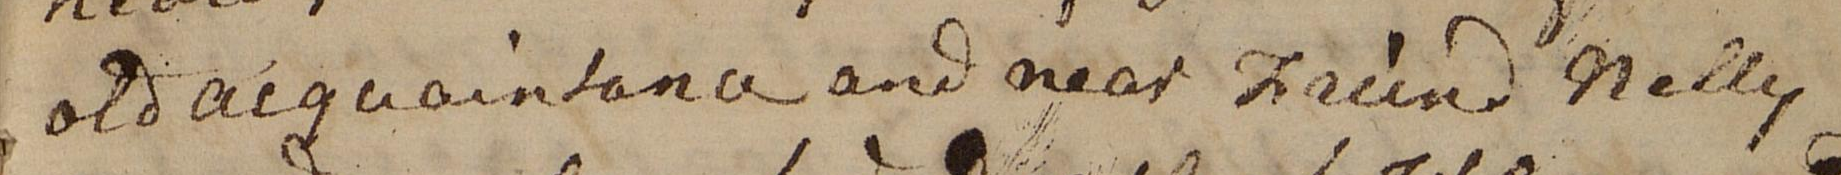old acquaintance and near Freind Nelly
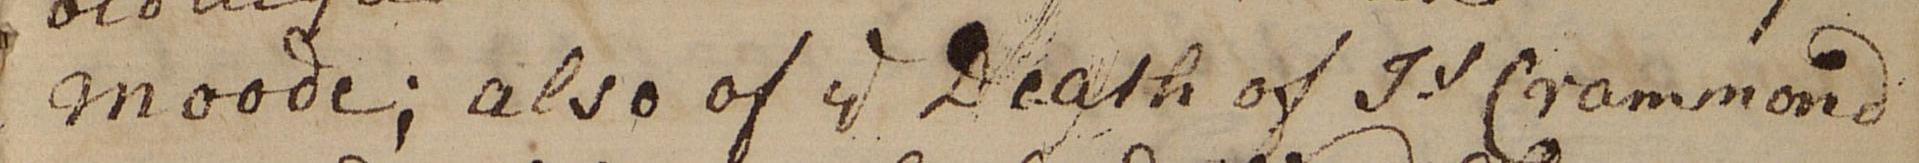Moode; also of y^e Death of J^s. Crammond
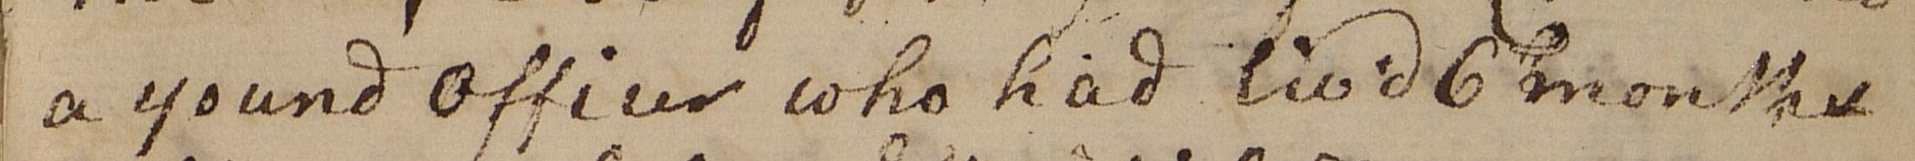a yound Officer who had liv'd 6 months
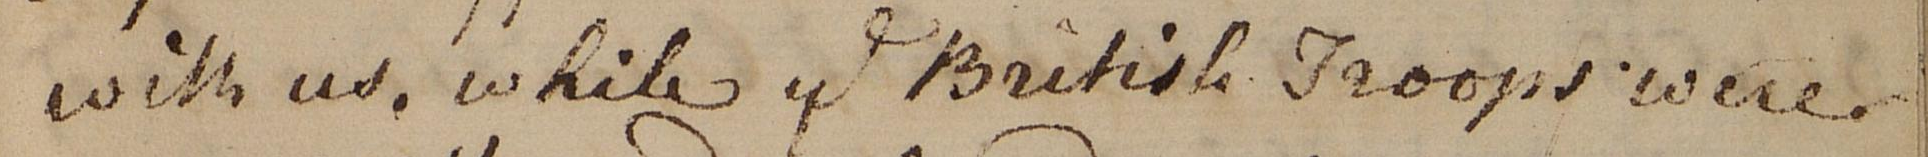with us, while y^e British Troops were.
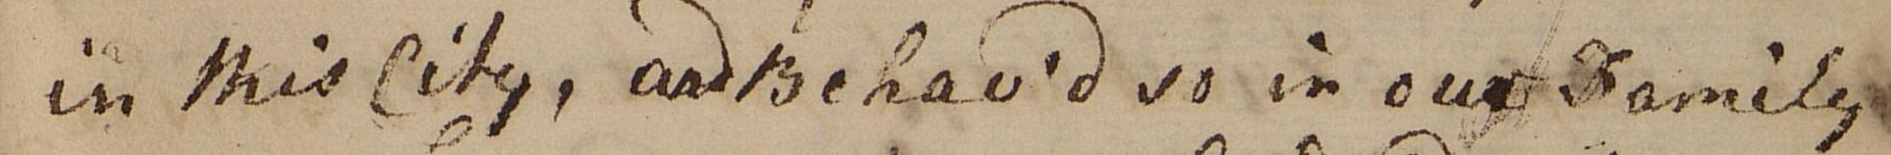in this City, and Behav'd so in our Family
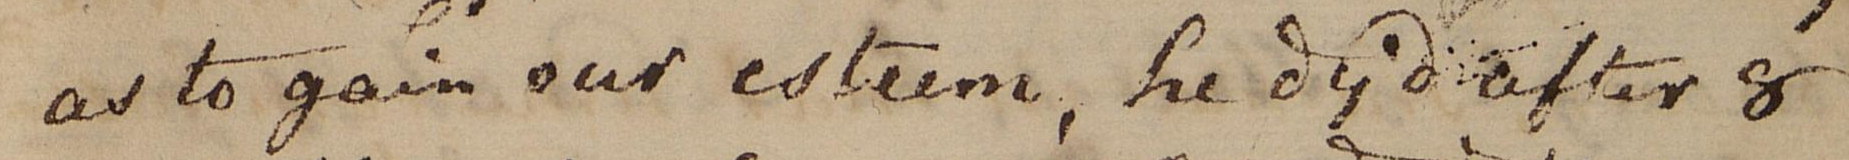as to gain sur esteem, he dy'd after 8
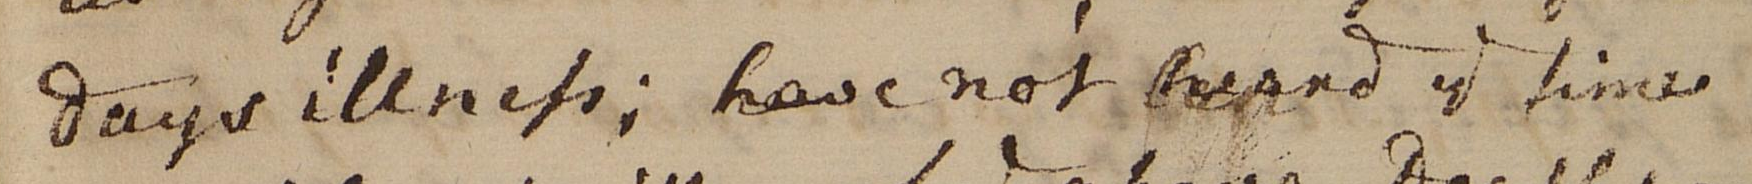days illness; have not brand y^e time
